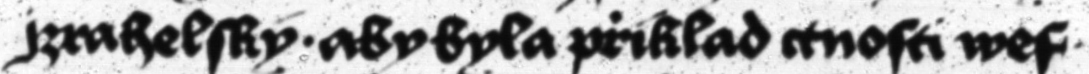izrahelſký. aby byla pṙíklad ctnoſti wef
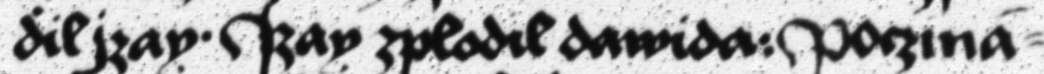ḋil izay. Izay zplodil dawida: Pocziná
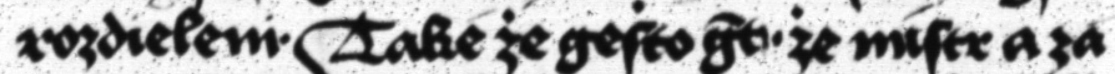rozdieleni. Také że geẛto ḡt že míſtr a za
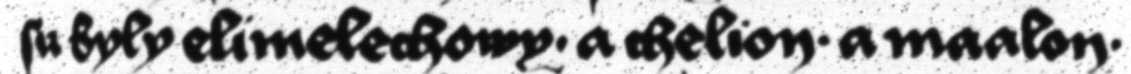ſu byly elimelechowy. a chelion. a maalon.
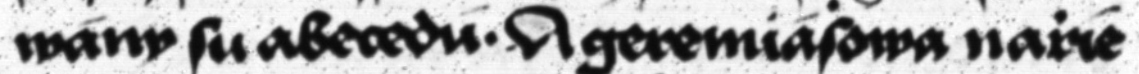wány ſu abecedú. A geremiáẛowa naṙíe
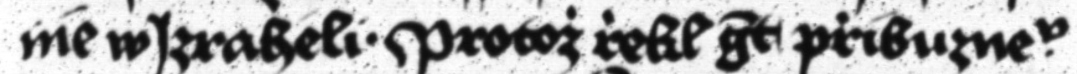ṅíe w Izrahéli. Protoż ṙekl ḡt pṙíbuznev
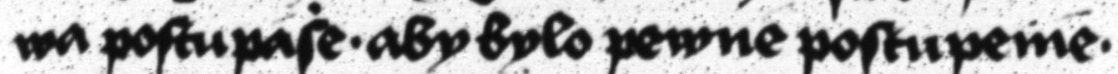wa poſtupáẛe. aby bylo pewné poſtupeṅíe.
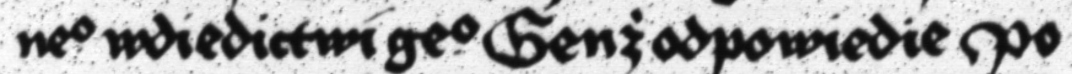ne° wdiedictwí ge° Genż odpowiedie Po
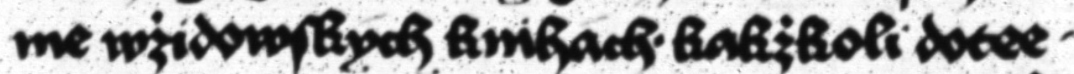me wżidowských knihách. kakżkoli dotee
